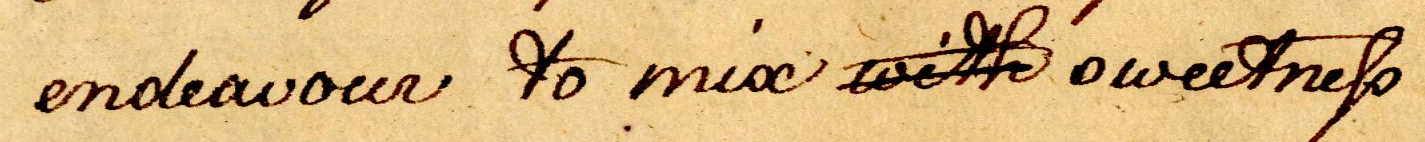endeavour to mix [with] sweetness
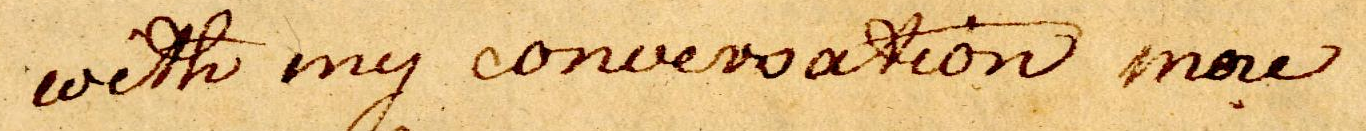with my conversation, more
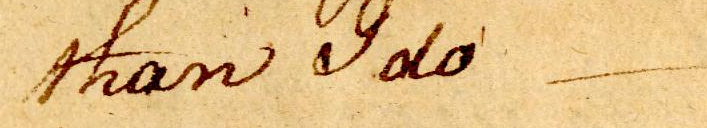than I do -
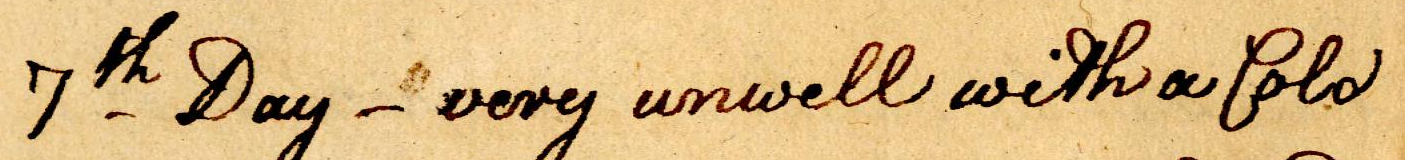7^th Day- very unwell with a Cold
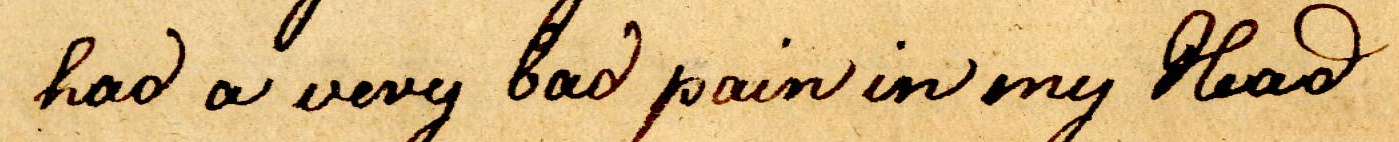had a very bad pain in my Head
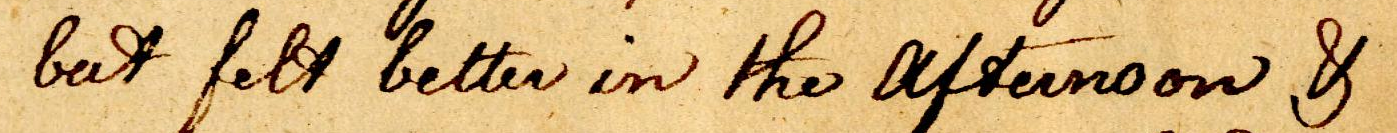but felt better in the Afternoon &
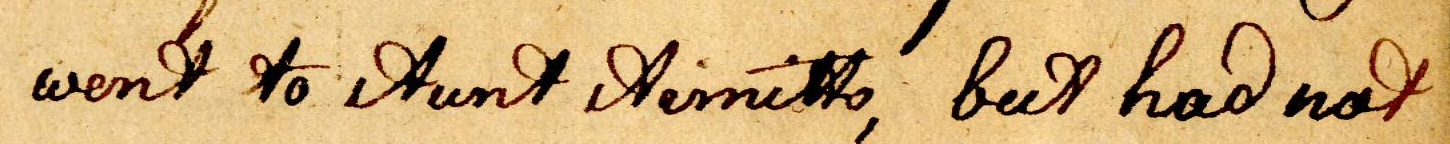went to Aunt Armitts, but had not
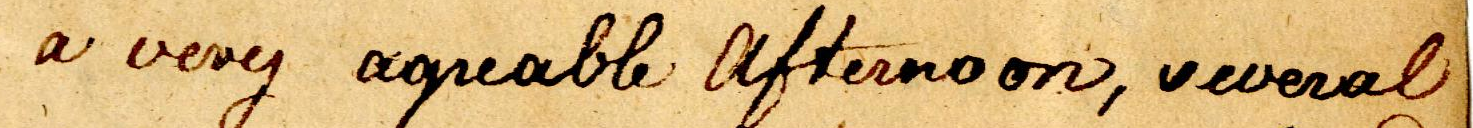a very agreable Afternoon, several
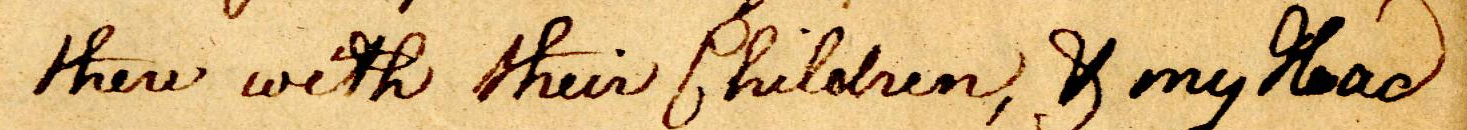there with their Children, & my Head
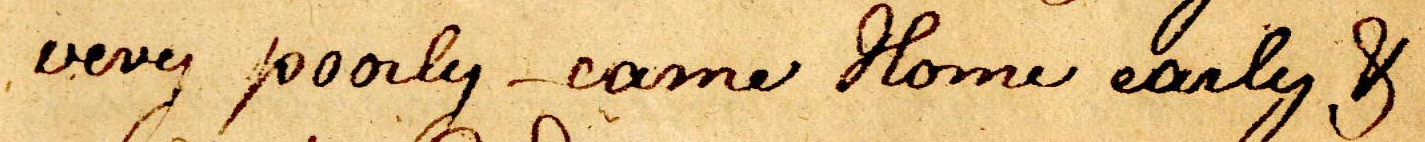very poorly- came Home early &
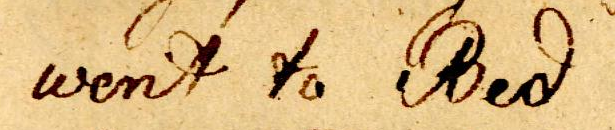went to Bed
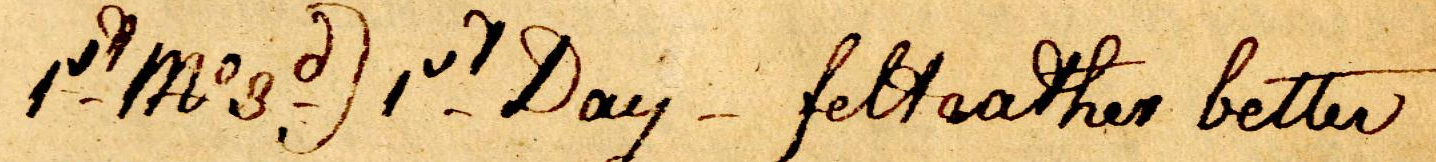1^st M^o 3^d) 1^st Day- felt rather better
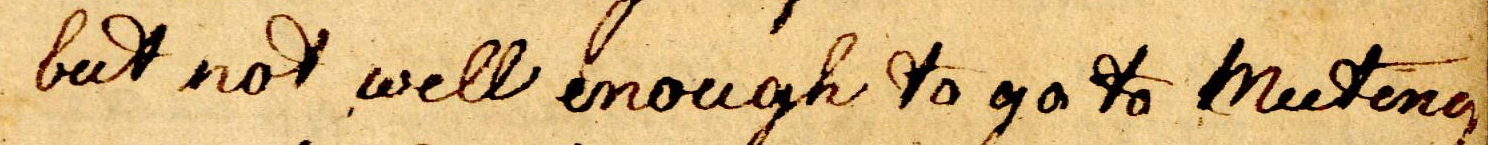but not well enough to go to Meeting
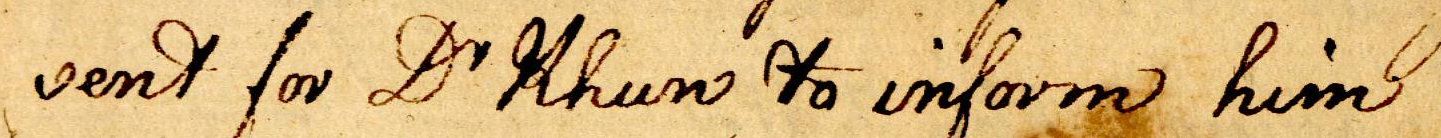sent for D^r Khun to inform him
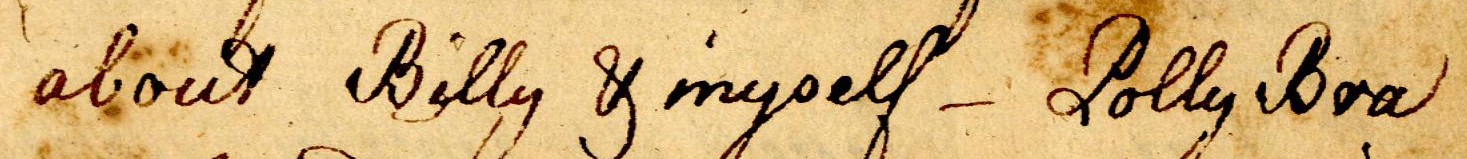about Billy & myself- Polly Bra
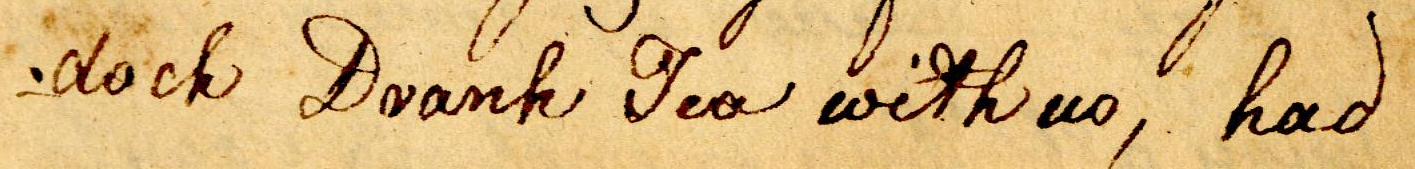-dock Drank Tea with us, had
